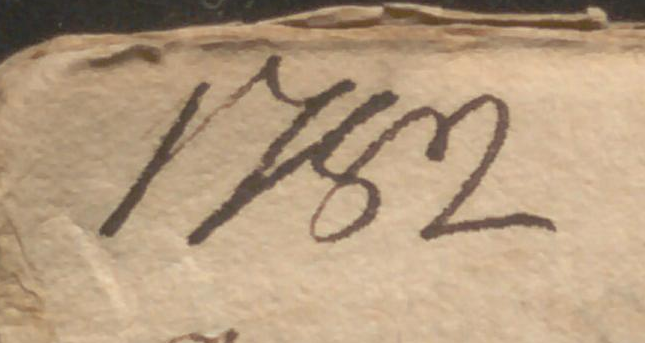1782
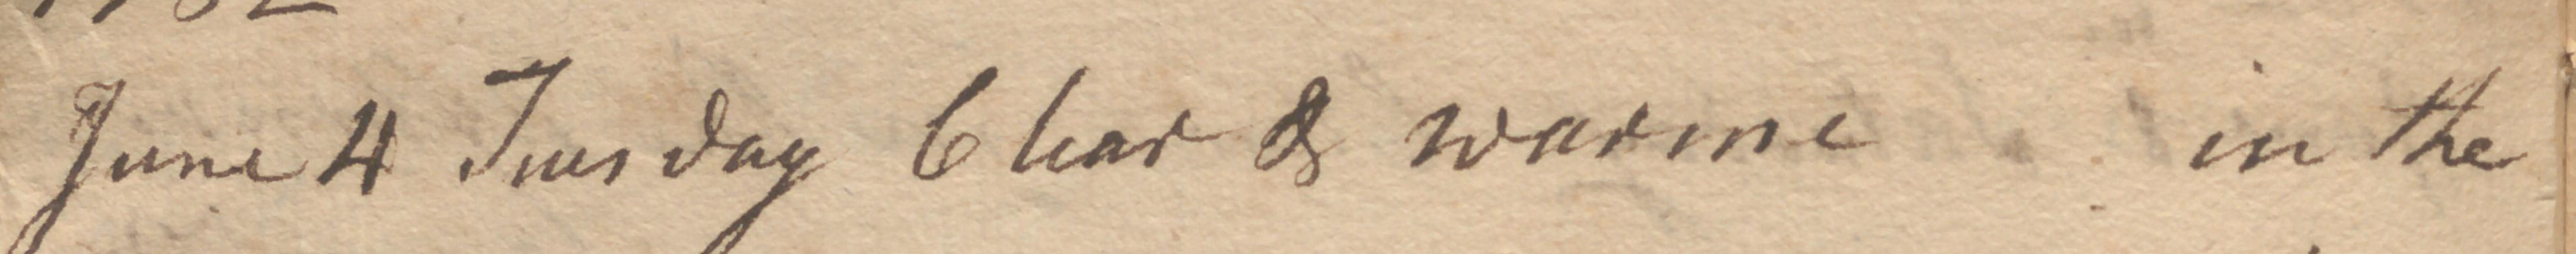June 4 Tuesday Clear & warme in the
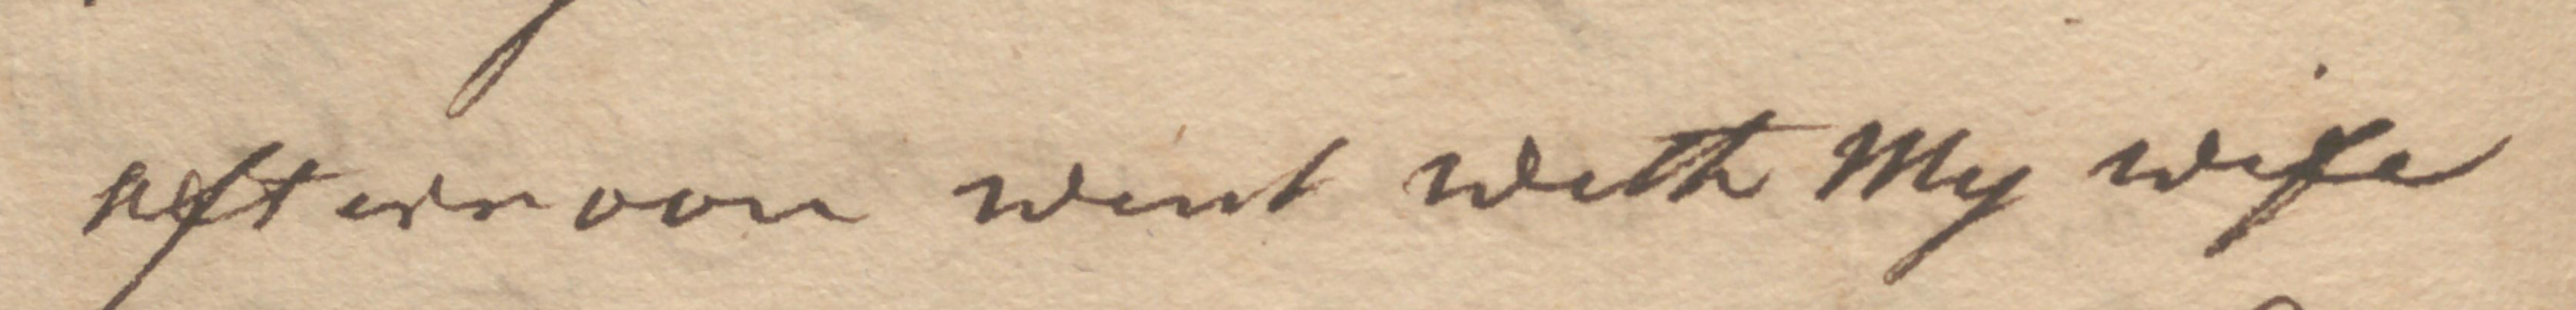afternoon went with My wife
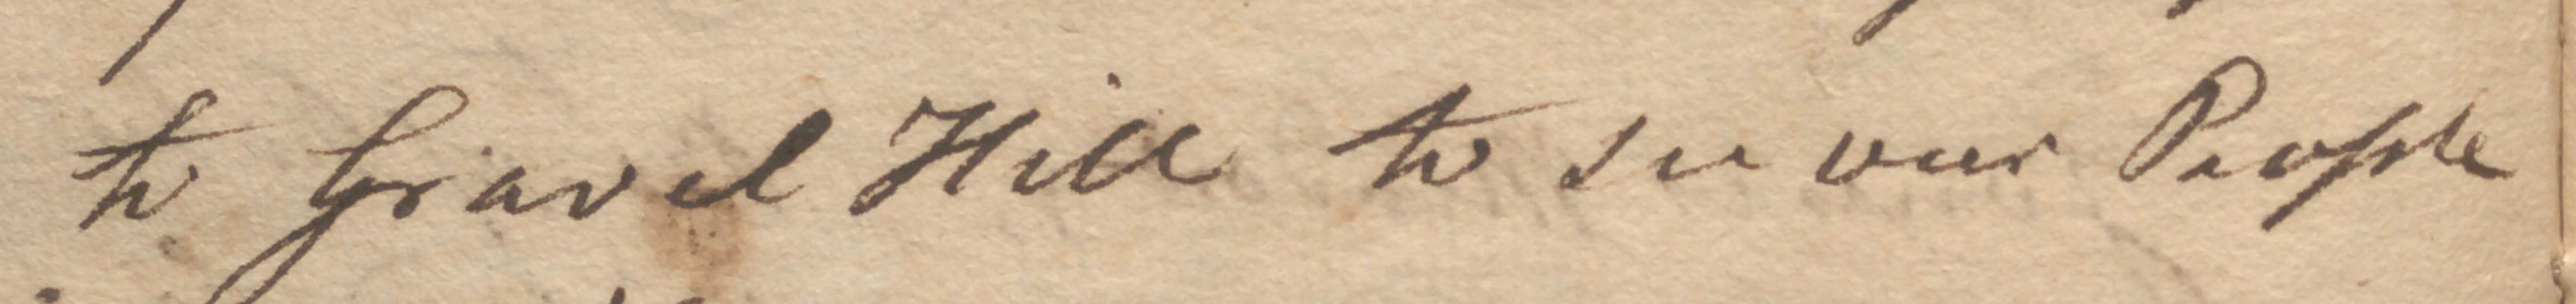to Gravel Hill to see our People
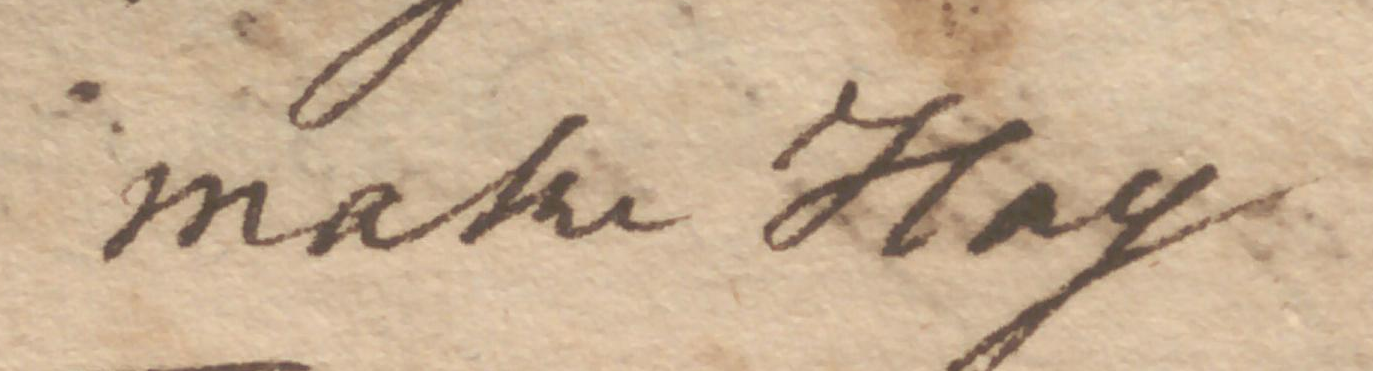make Hay
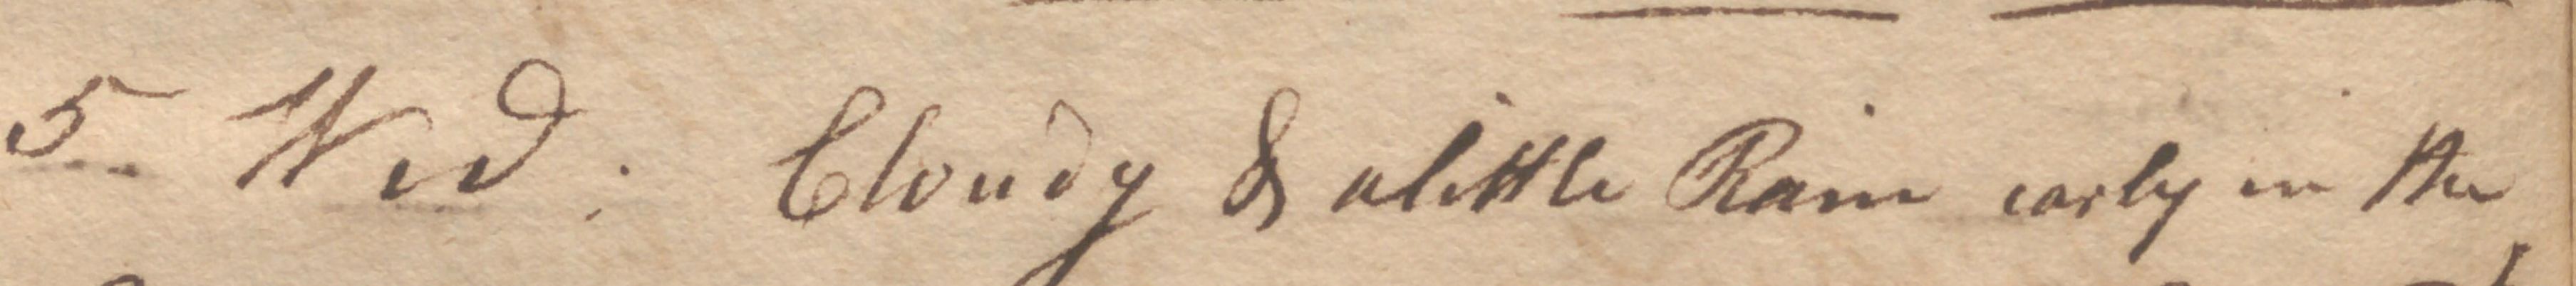5 Wed. Clouoy & a little Rain early in the
